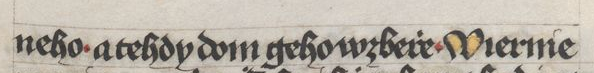neho.a tehdy dom geho wzbeṙe.Viernie
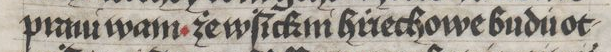pravi wam. że wẛickni hṙiechowe budú ot¬
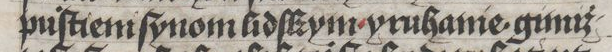puẛtieni ſynom lidſkym.y ruhanie.gimiż¬
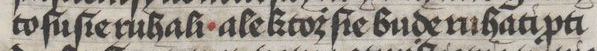to ſu ſie ruhali.ale ktoż ſie bude ruhati ꝓti
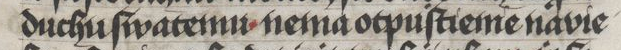duchu ſwatemu. nema otpuẛtienie navie¬
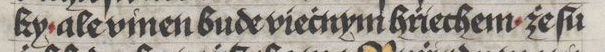ky.ale vinen bude vieċnym hṙíechem.że ſu
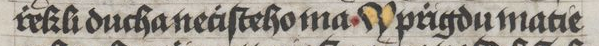ṙekli ducha neċiſteho ma.Y pṙigdu matie
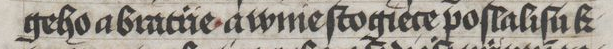geho a bratṙie.a wnie ſtogíece poſlali ſu k
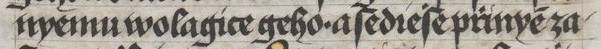nemu wolagíce geho.a ſedíeẛe pṙinyē za¬
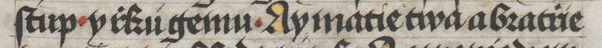ſtup.y ṙkú gemu.Ay matie twá a bratṙíe
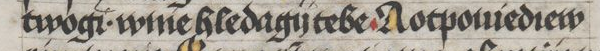twogí.wnie hledagij tebe.A otpowiediew
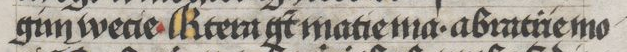gim wecie.Ktera ḡt matíe ma.a bratṙíe mo¬
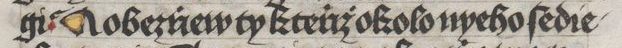gi? A obezṙiew ty kteṙiż okolo nyeho ſedie¬
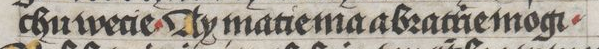chu wecie.Ay matie ma a bratṙie mogi.
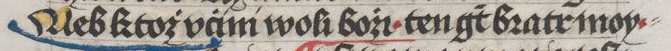Neb ktoż uċiní woli bożi.ten ḡt bratr moy
